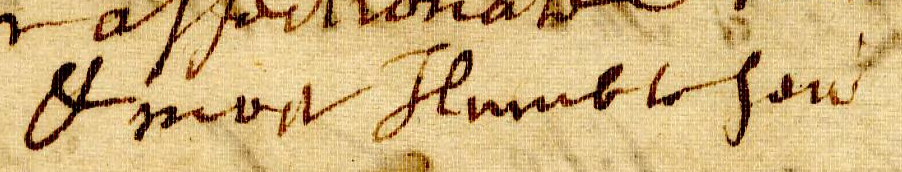& most Humble Serv^t
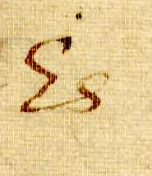ES
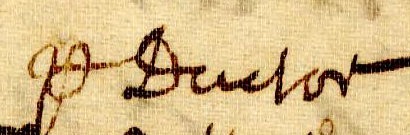per Doctor
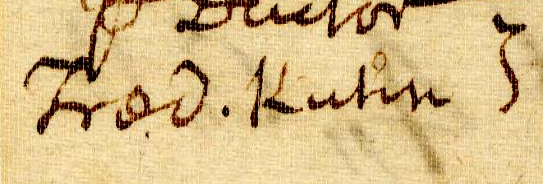Fred. Kuhn
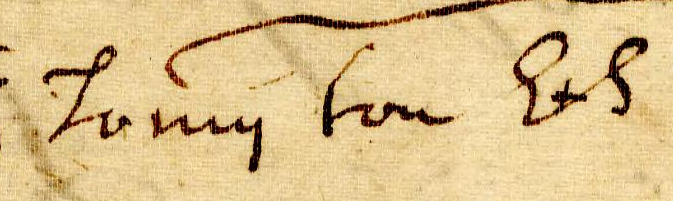To my Son E+S
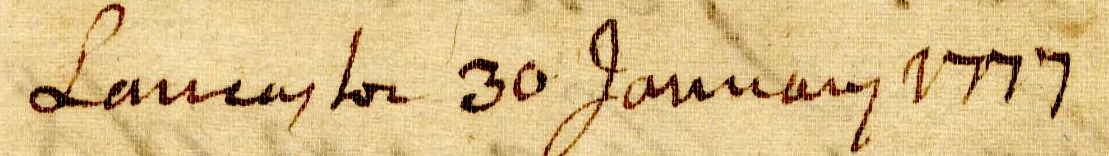Lancaster 30 January 1777
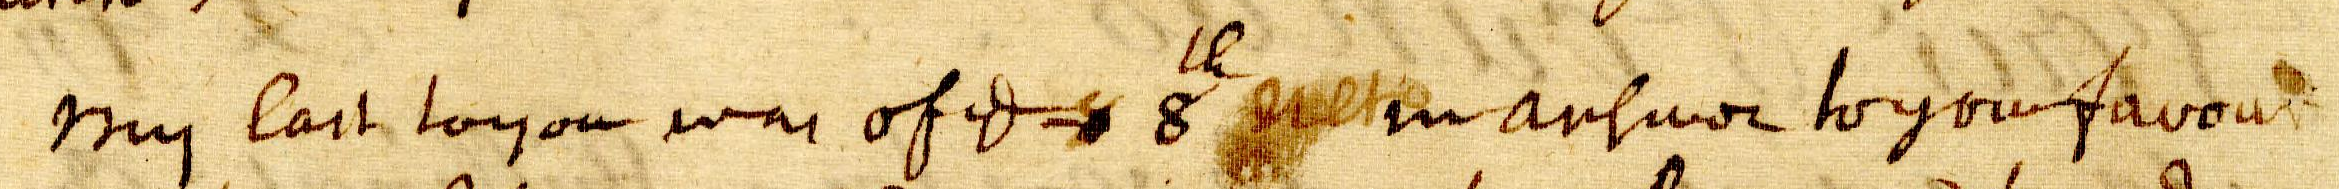My last toyou was of y^e 8^th Ult^o answer to you favour
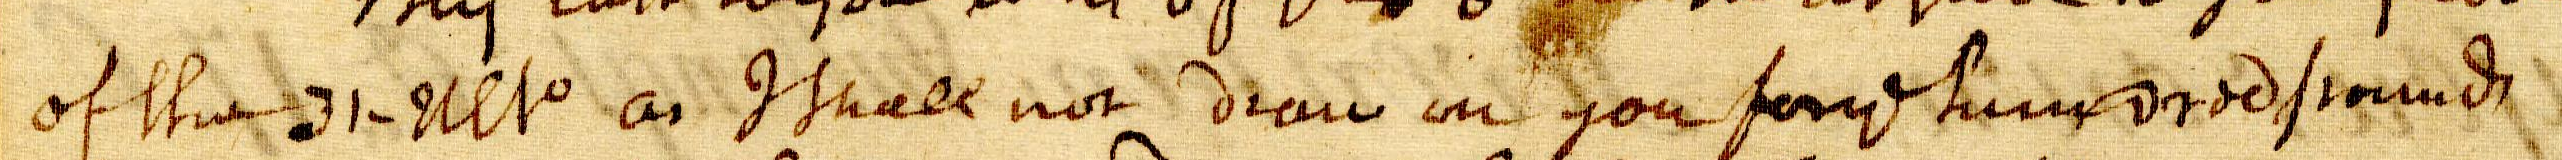of the 31- Ult^o as I shall not draw in you for y^e hundred friends
